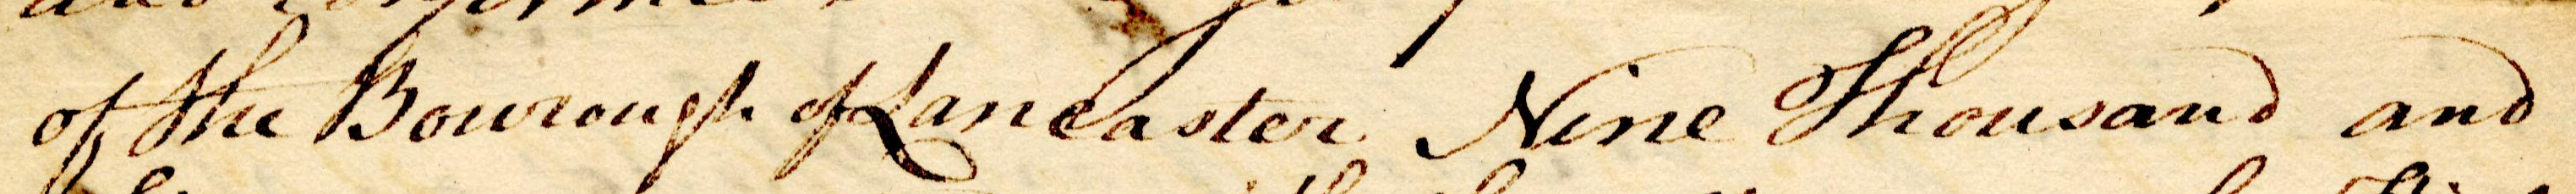of the Borough of Lancaster. Nine Thousand and
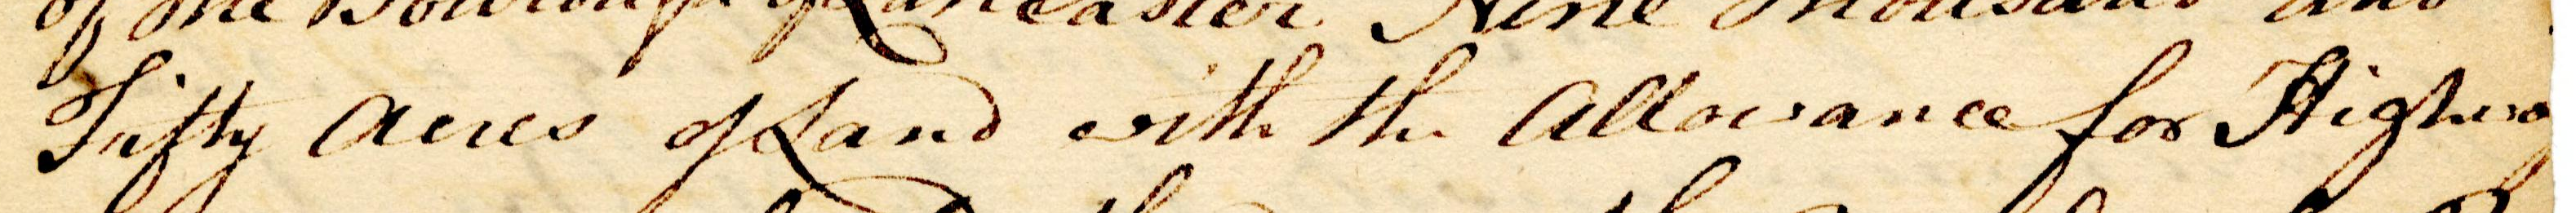Fifty acres of Land with the Allowance for Higher
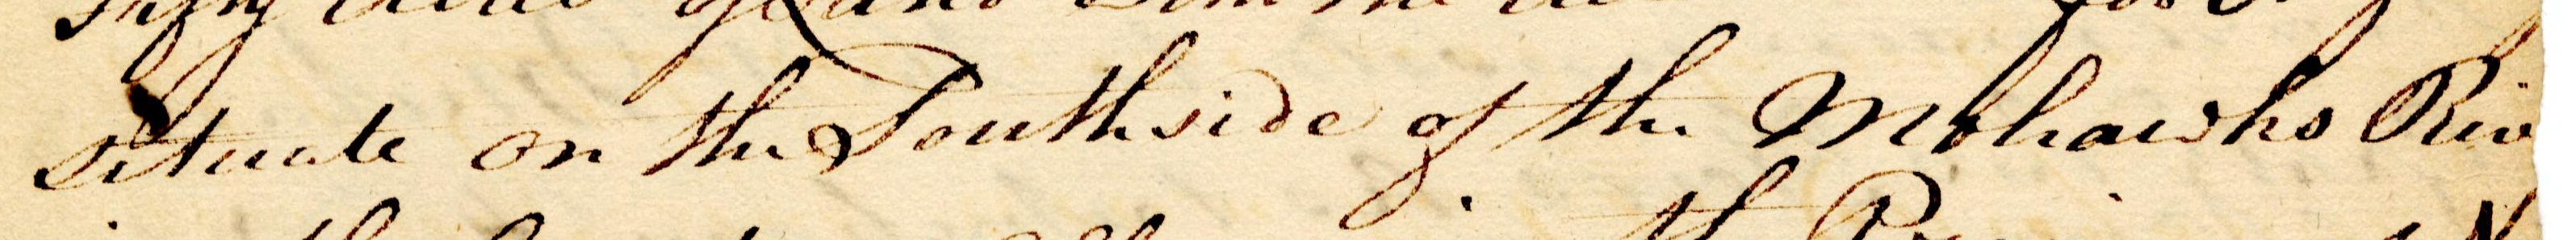situate on the Southside of the Mohawks Riv
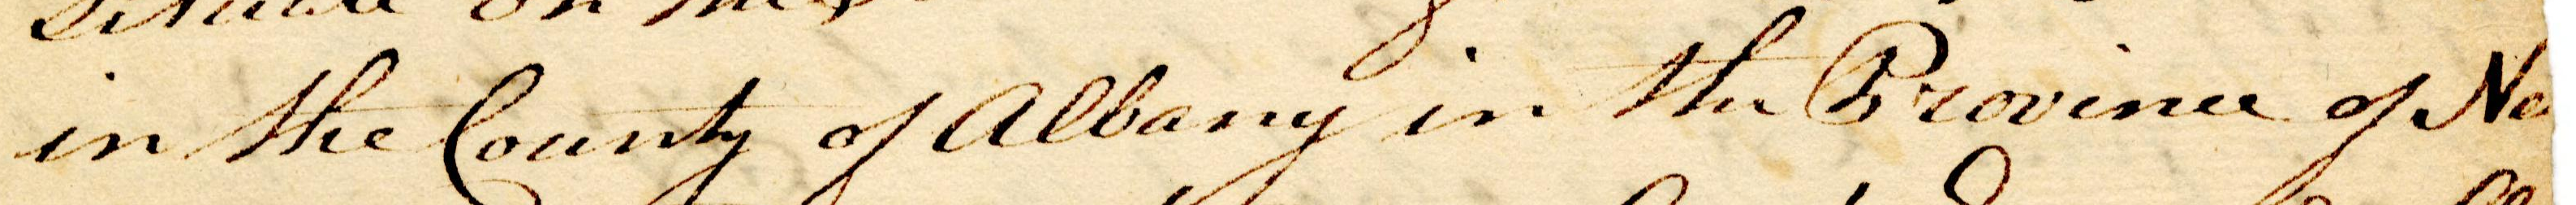in the County of Albany in the Province of Ne
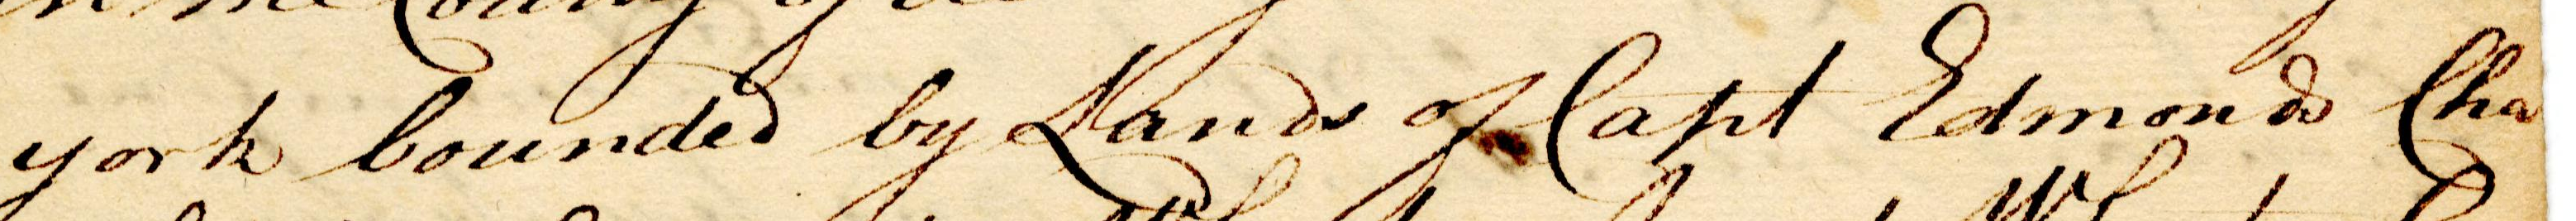york bounded by Lands of Capt Edmonds Cha
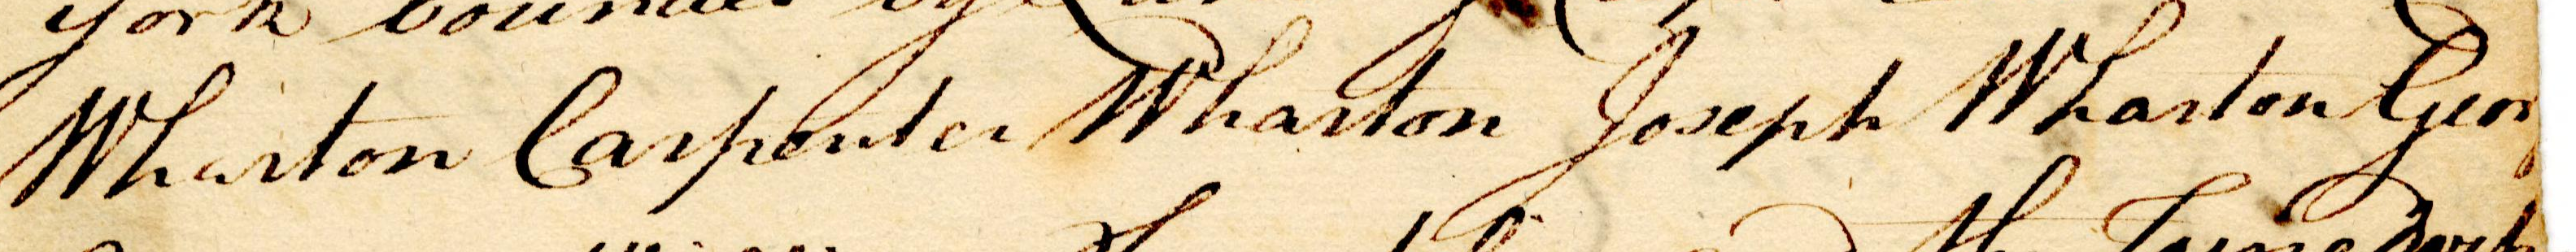Wharton Carpenter Wharton Joseph Wharton Gen
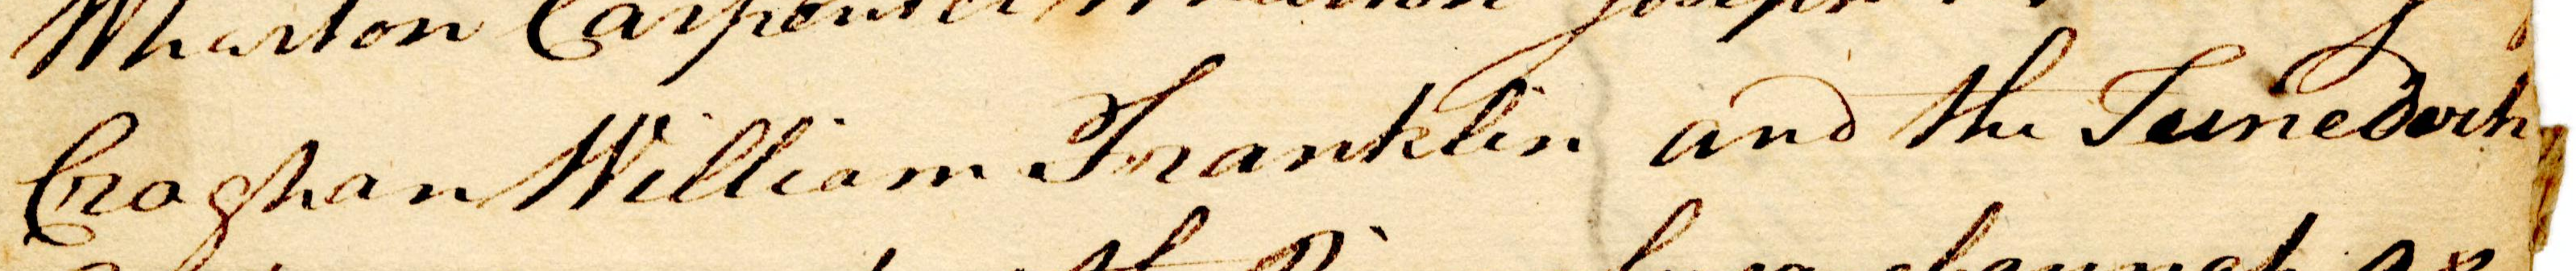Croghan William Franklin and the Tunedock
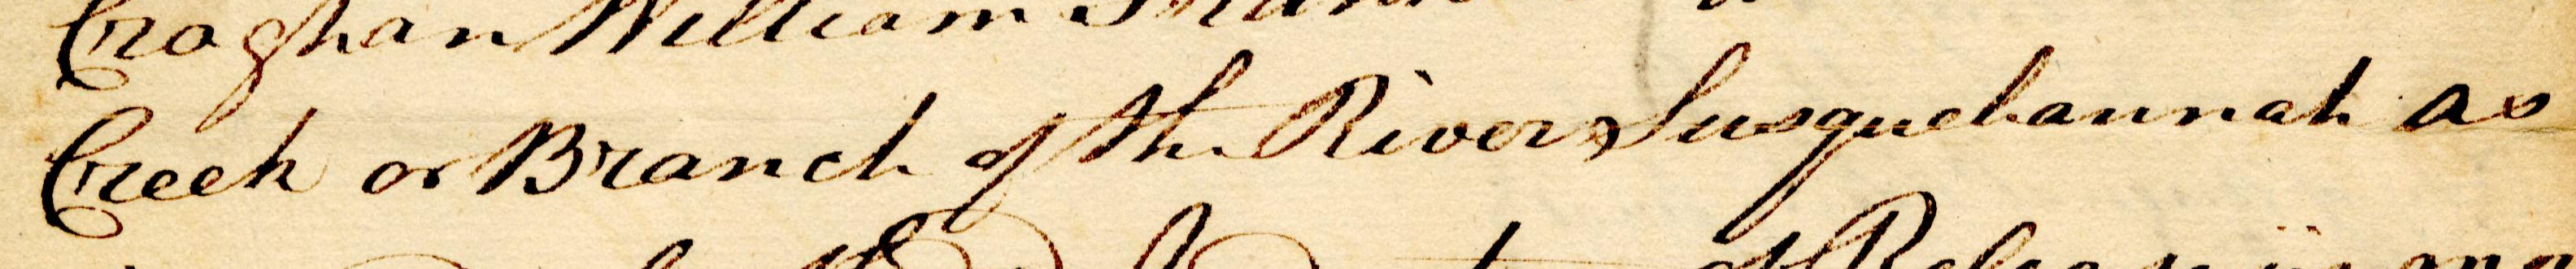Creek or Branch of the River Susquehannah as
